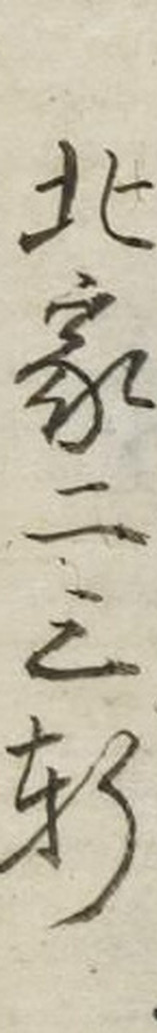北家二三軒
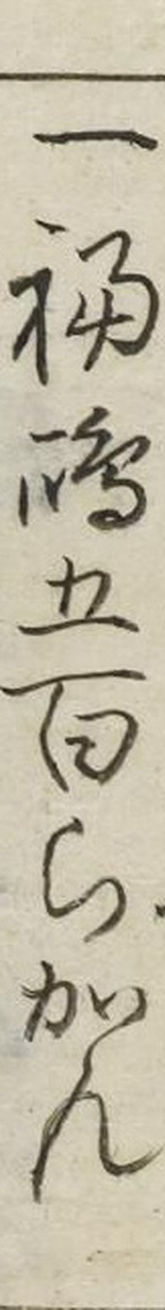一福嶋五百らかん
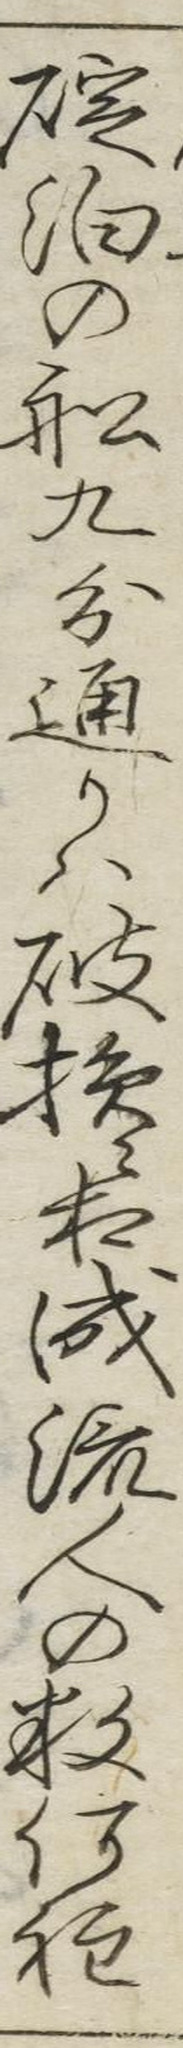碇泊の船九分通りハ破損ニ相成流人の数何程
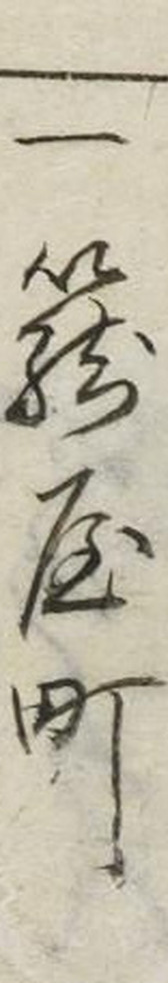一籠屋町
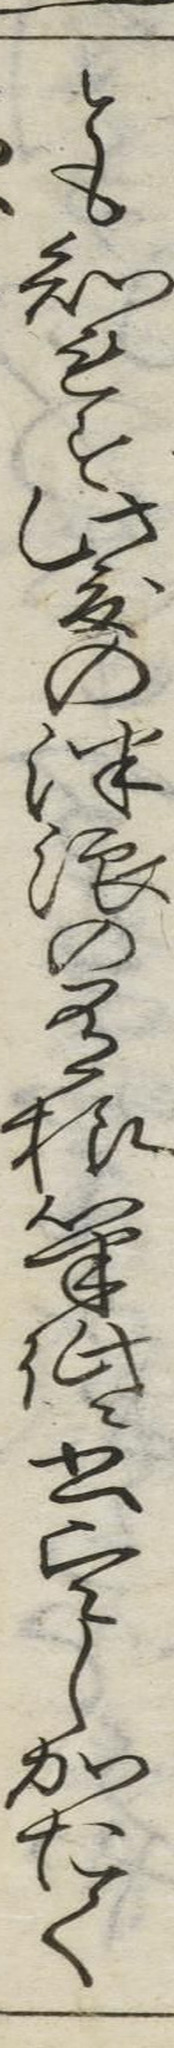とも知れす此度の津浪の有様筆紙ニ書尽しかたく
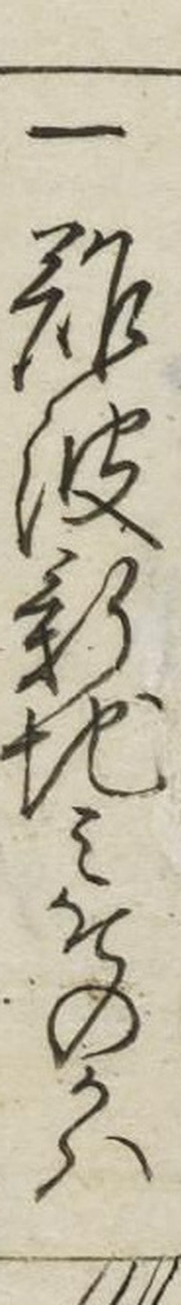一難波新地ミそのかハ
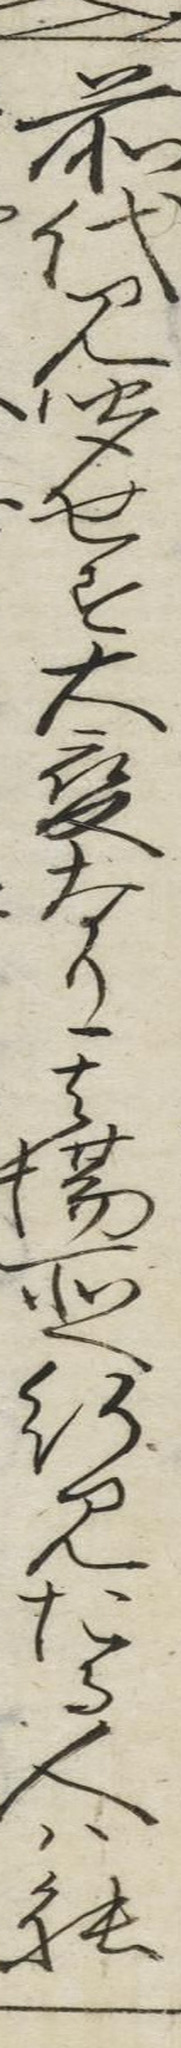前代見聞せす大変なり其場所へ行見たる人ハ能
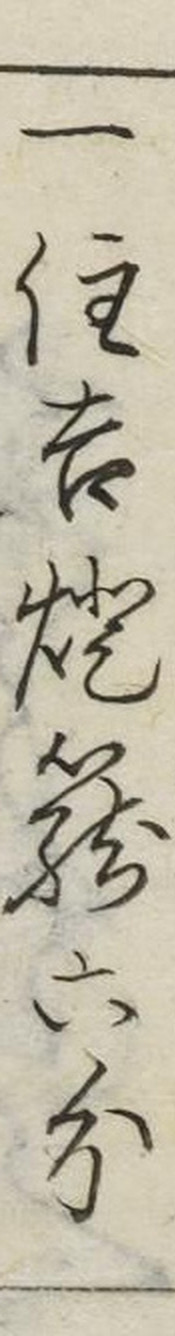一住吉燈籠六分
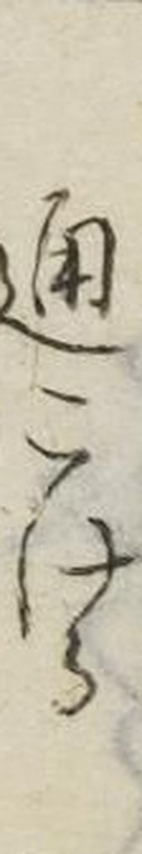通こける
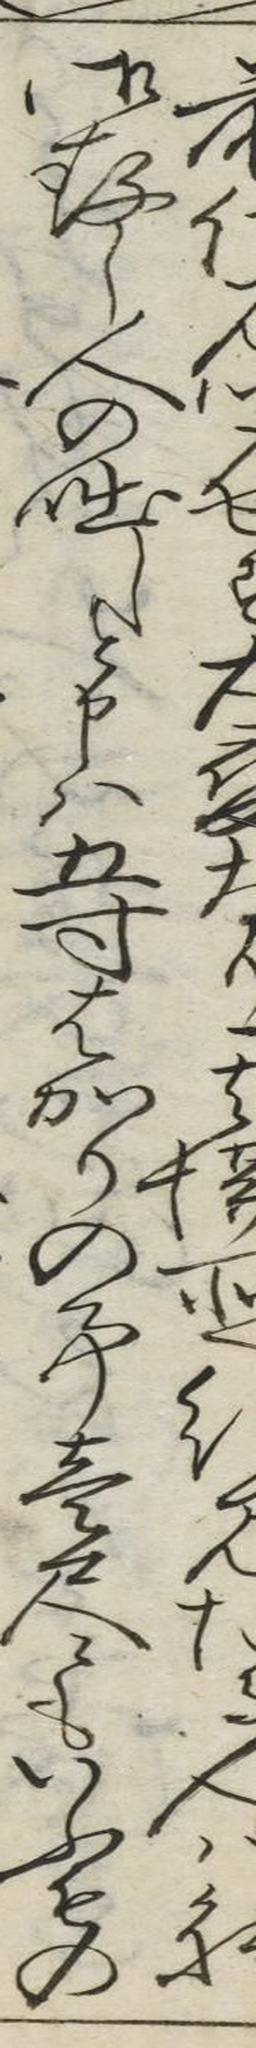御存し人の咄しと申ハ五寸はかりの事壱尺ニもいふもの
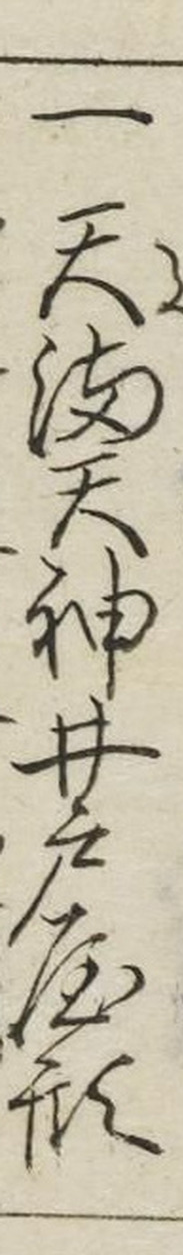一天満天神井戸屋形
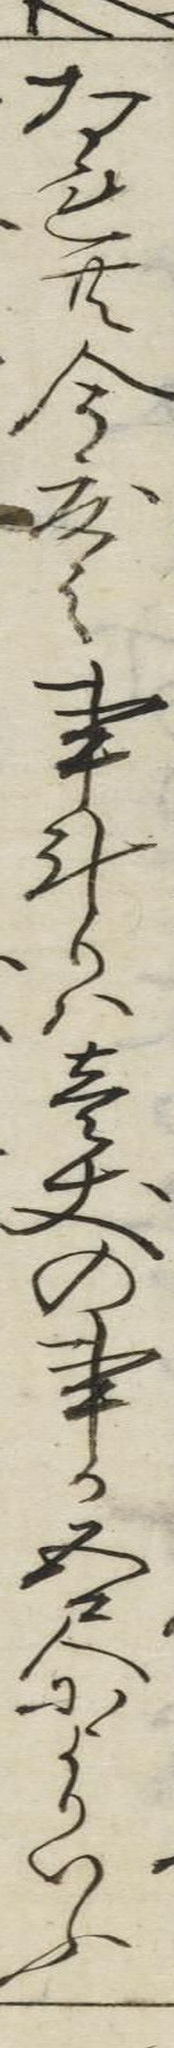なれ共今度之事計りハ壱丈の事か五尺によりいふ
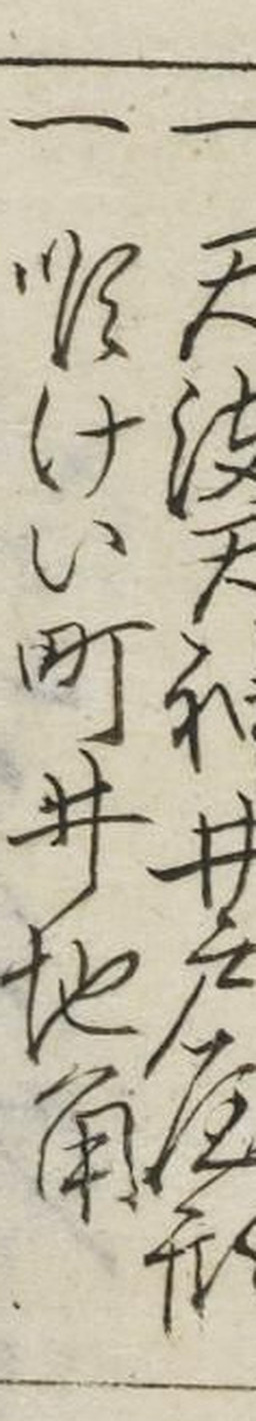一順けい町井地角
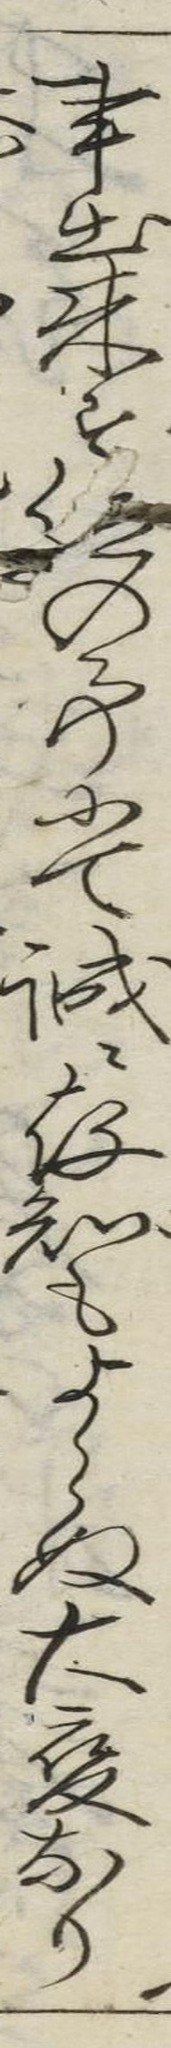事出来す仰の事にて誠ニ存知もよらぬ大変なり
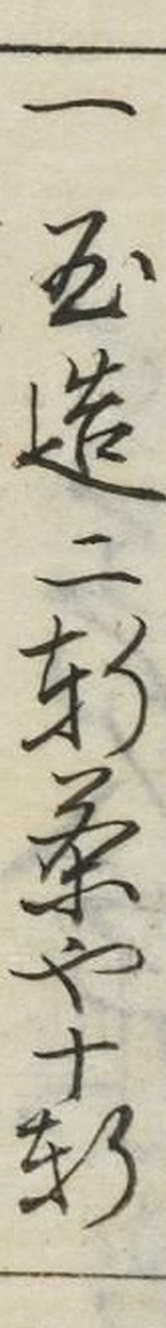一玉造二軒茶や十軒
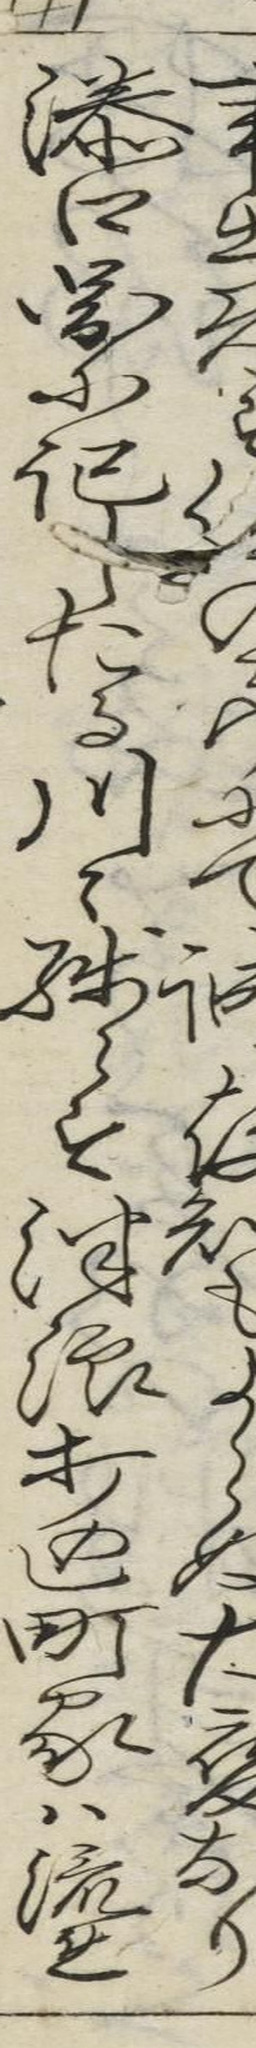湊口図に記したる川々残らす津浪打込町家ハ流れ
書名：大地震實録
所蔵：東京大学地震研究所図書室 Earthquake Research Institute Library, The University of Tokyo, JAPAN
